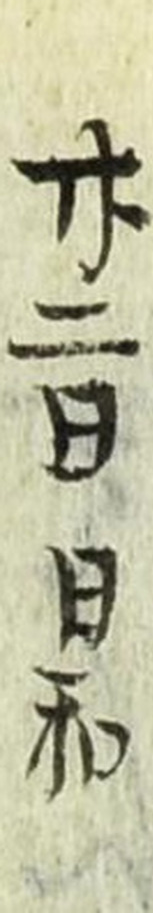十九日日和
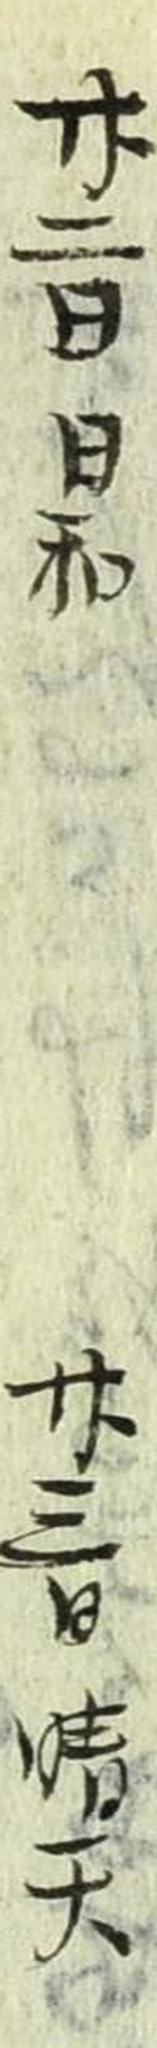廿二日日和廿三日晴天
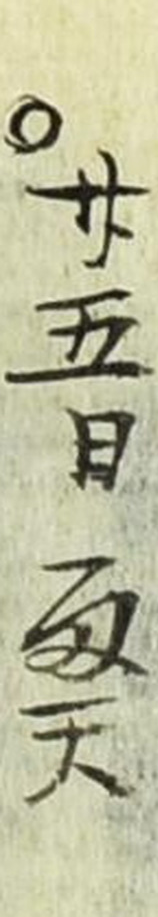○廿五日雨天
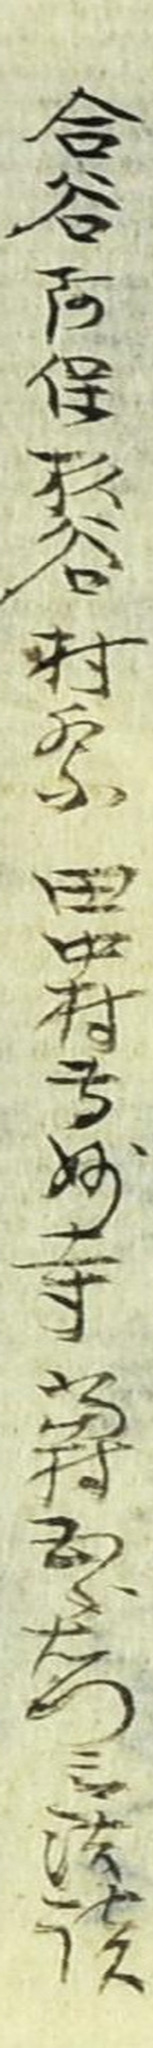合谷阿保杉谷村祭田中村専妙寺当村五郎右衛門に而法談
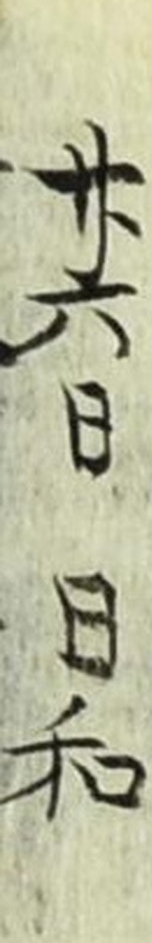十九日日和
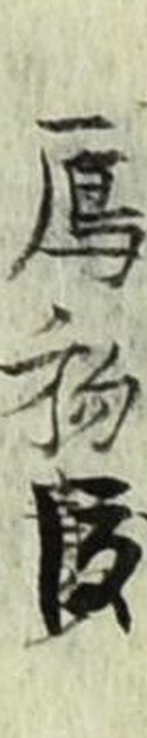雁初渡
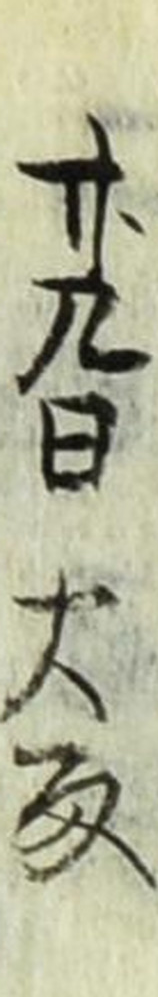廿九日大雨
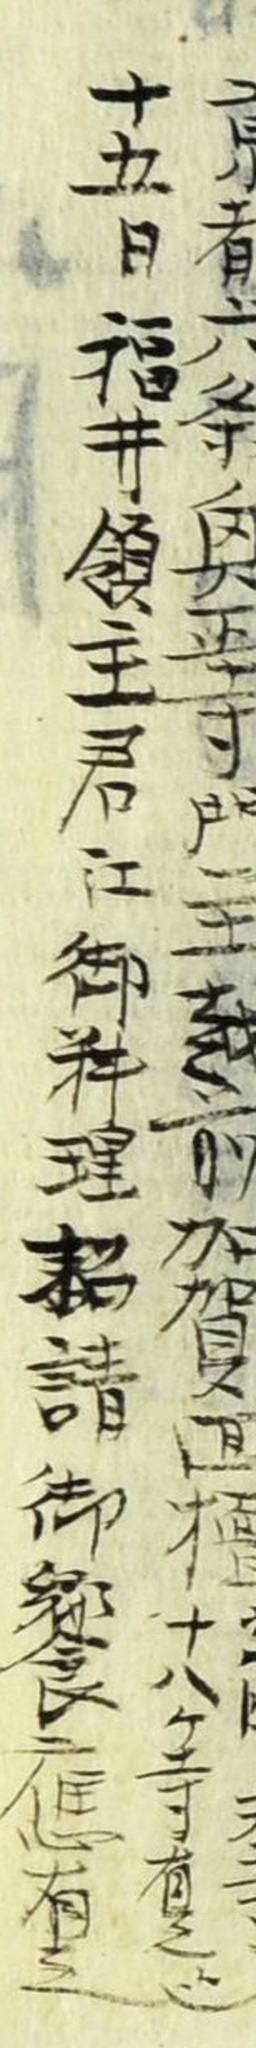十五日福井領主君え御料理招請御饗応有之

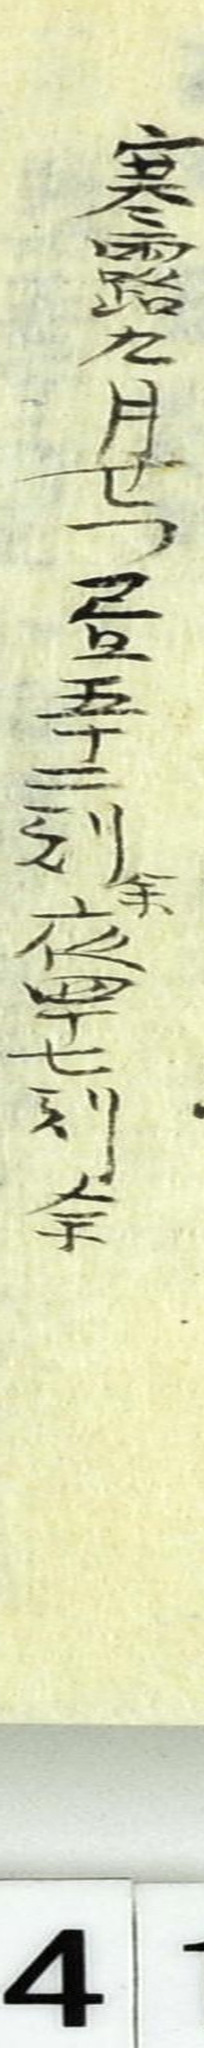寒露九月せつ昼五十二刻余夜四十七刻余
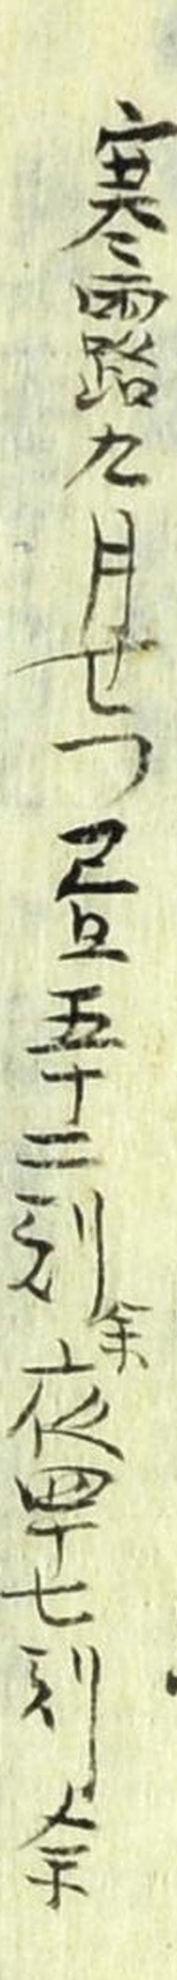寒露九月せつ昼五十二刻余夜四十七刻余
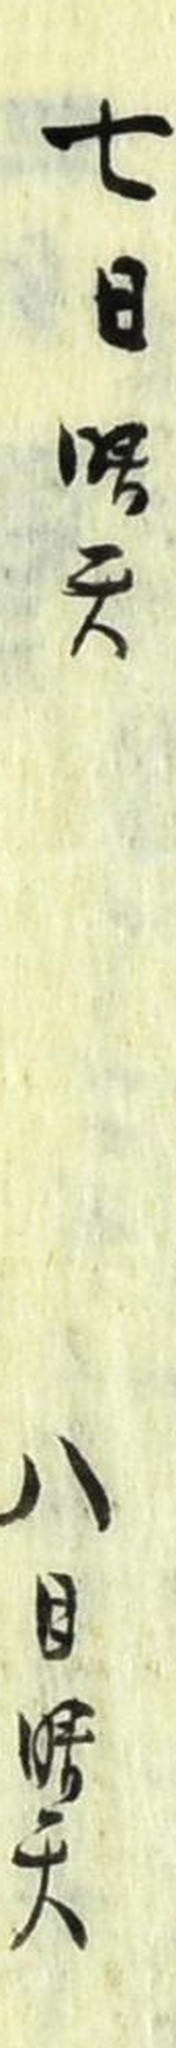七日晴天八日晴天
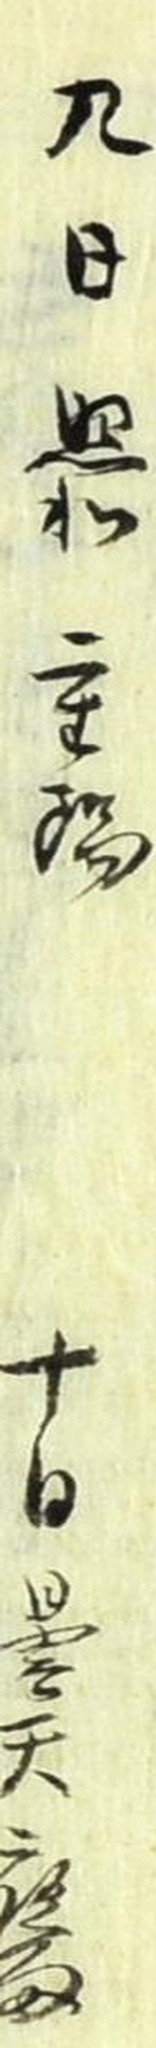九日照和重陽十日曇天夜雨
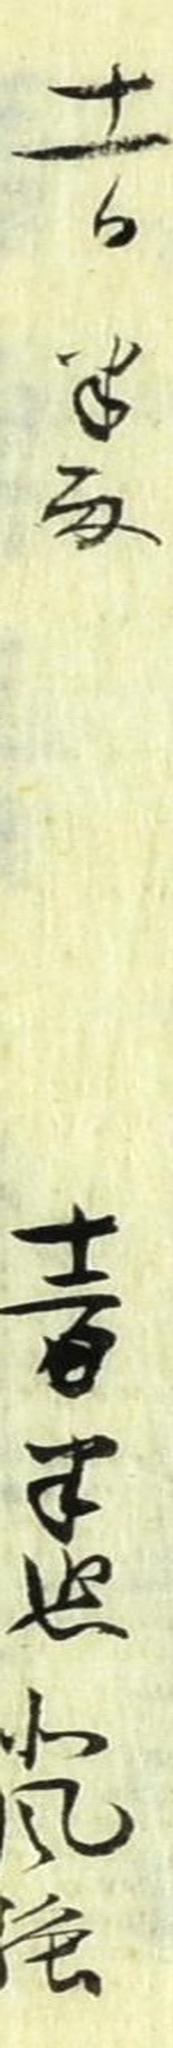十一日半雨十二日半照北風強
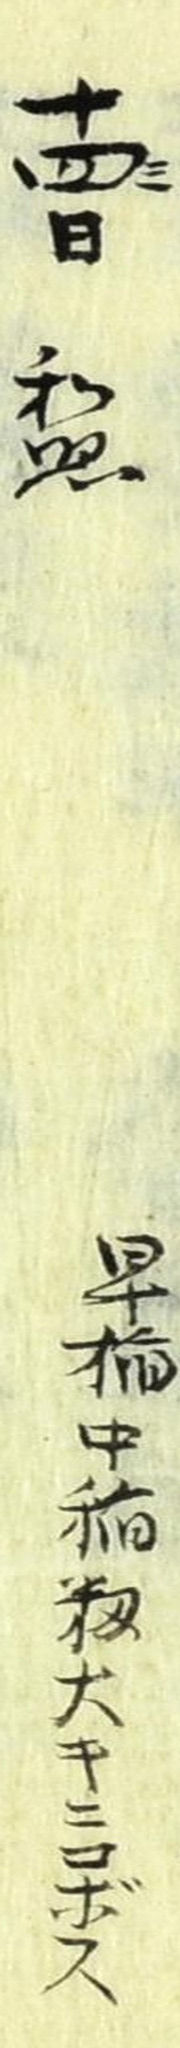十四日和照早稲中稲籾大きにこぼす
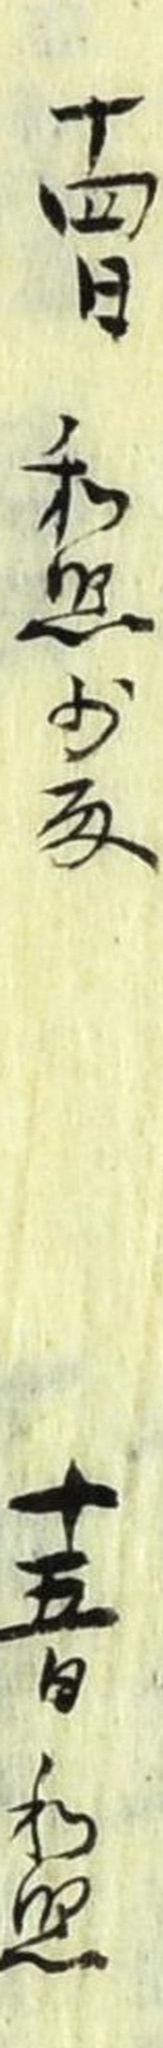十四日和照少雨十五日和照
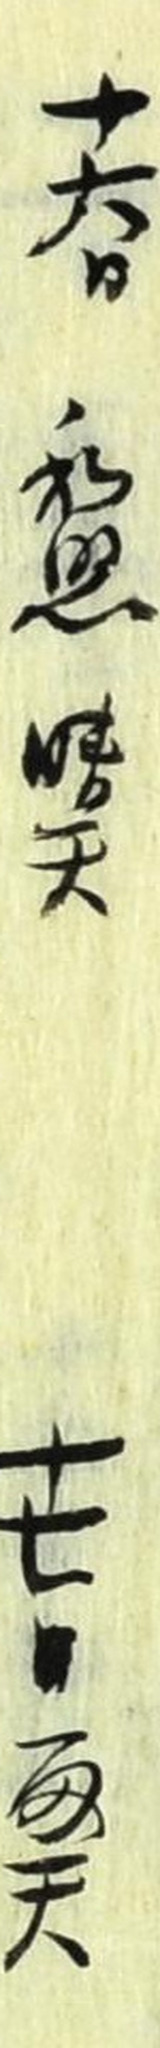十六日和照晴天十七日雨天
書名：（日記）
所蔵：福井県文書館 Fukui Prefectural Archives
